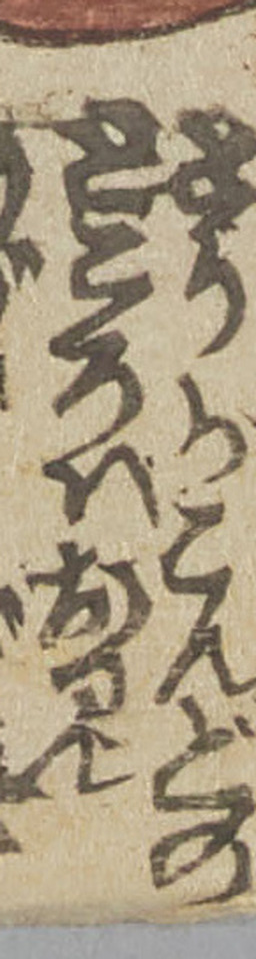ところはお見
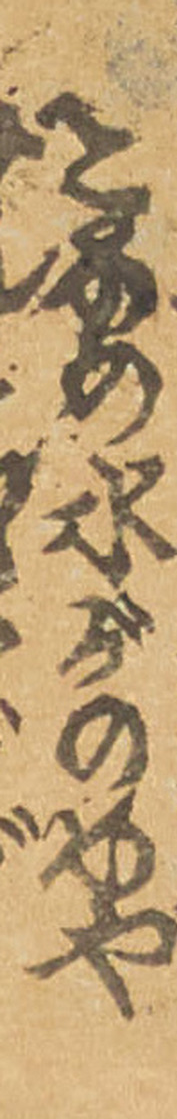この水がのめや
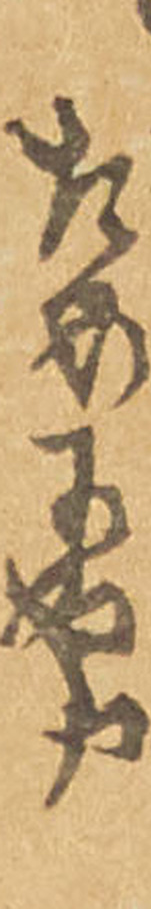ためにや力
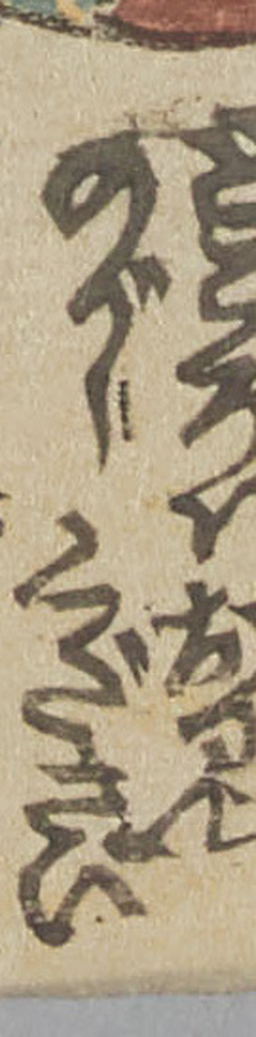のがしください
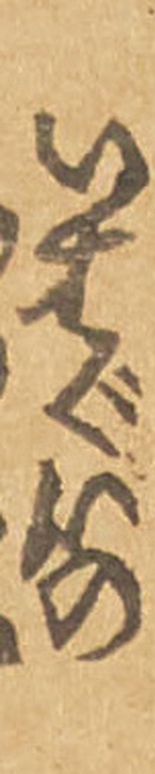いはぐいの
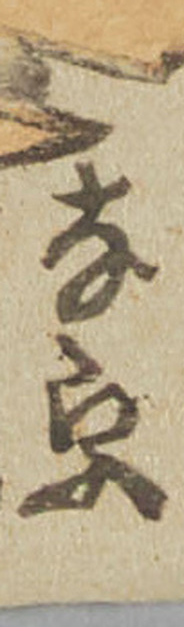ならふ
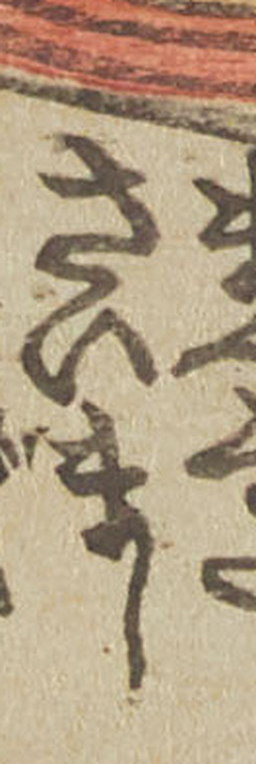さいまし
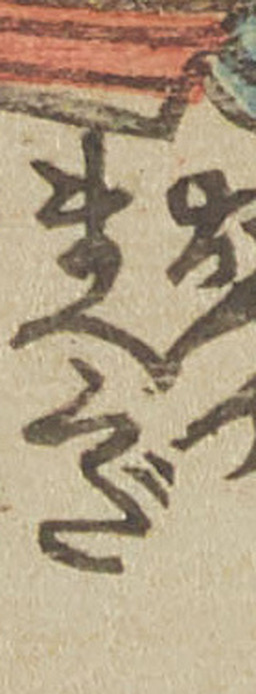まへくだ
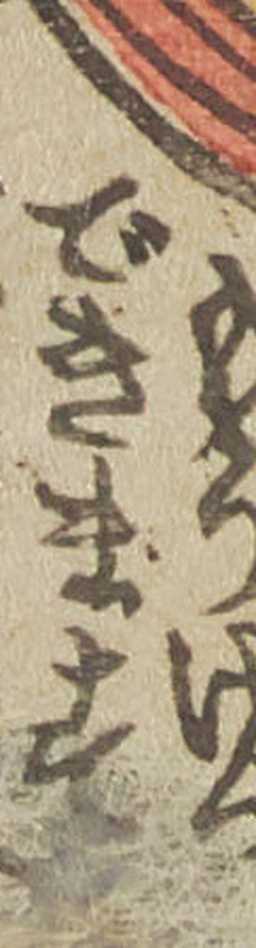できます
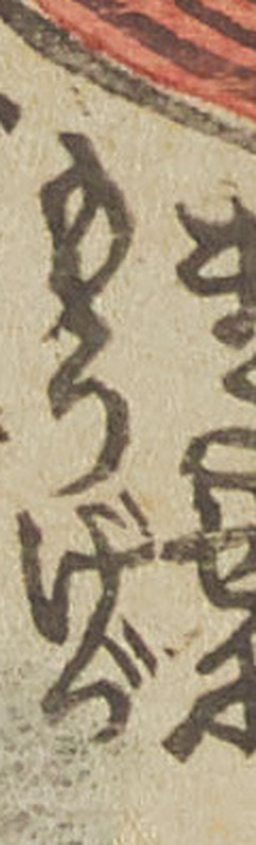もうげが
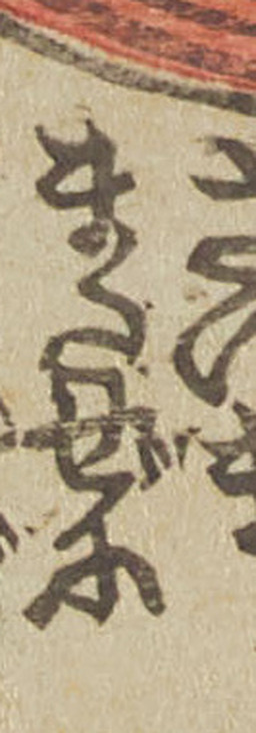またぜに
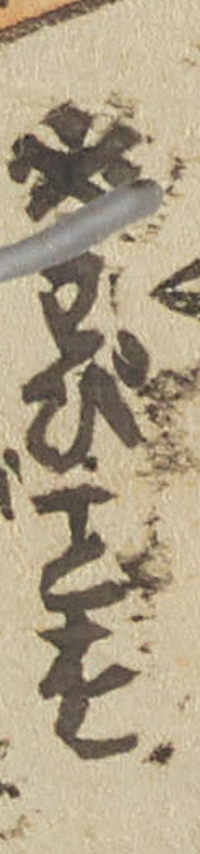※わびことを
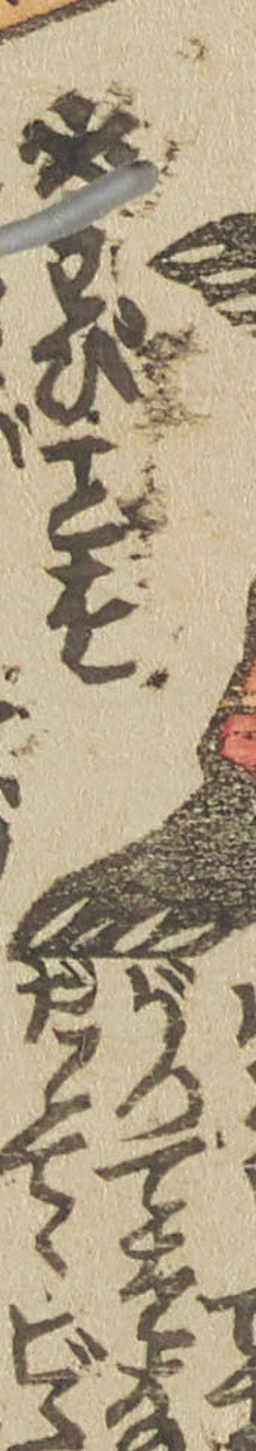※わびことを
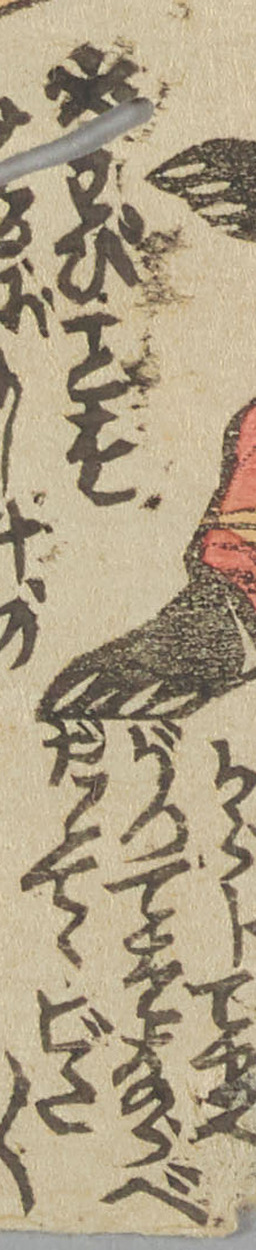※わびことを
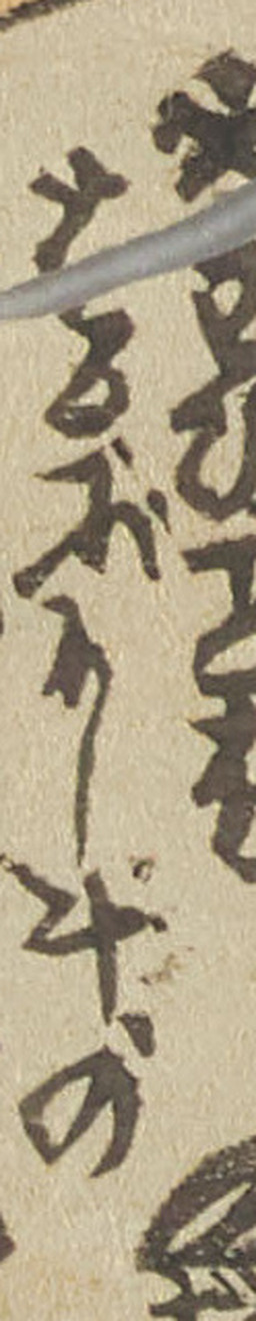するにかしまの
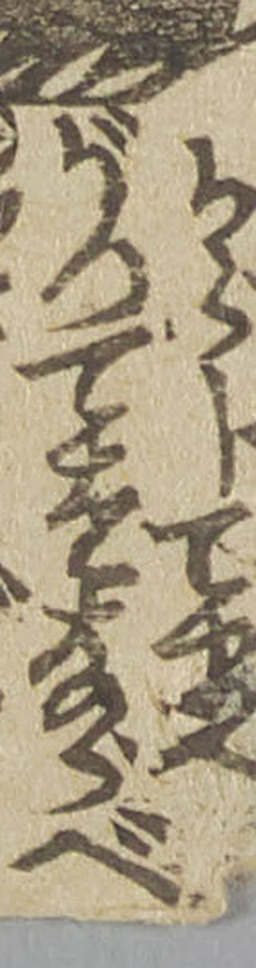がつてをならべ
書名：生捕ました三度の大地震
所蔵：東京大学総合図書館 General Library in the University of Tokyo, JAPAN
